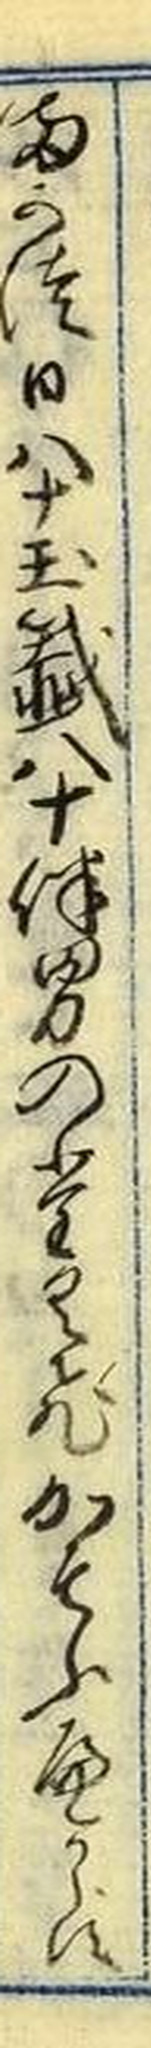まかす日八十玉籤八十伴男のたくひかそふへからす
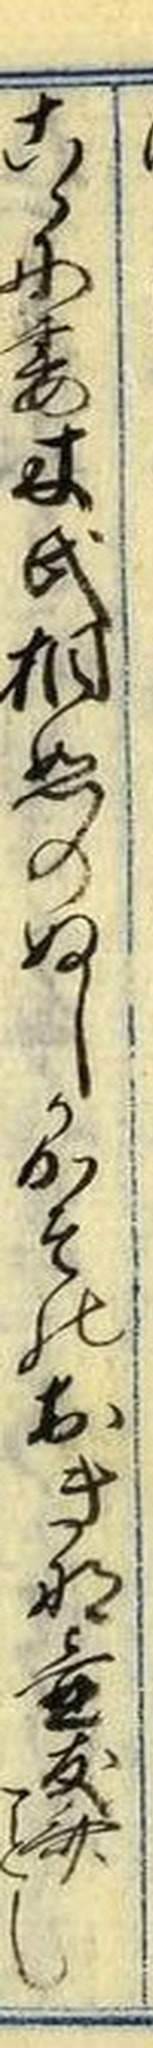こゝに妻木氏相怒のぬしかかそのおきな壷友斎ことし
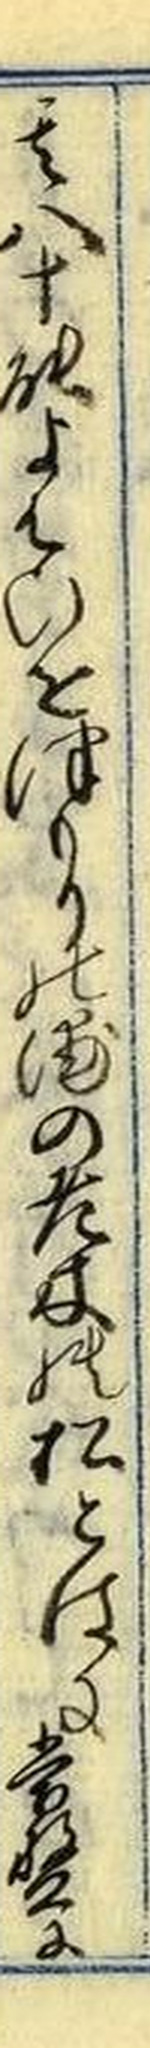其八十のよはひをつもりの浦の老木の松とはに常盤に
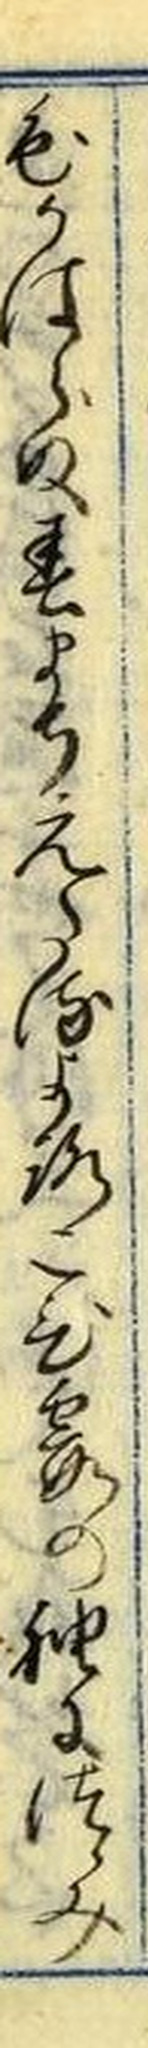色かはらぬ春まちえたるよろこひ露の袖につゝみ
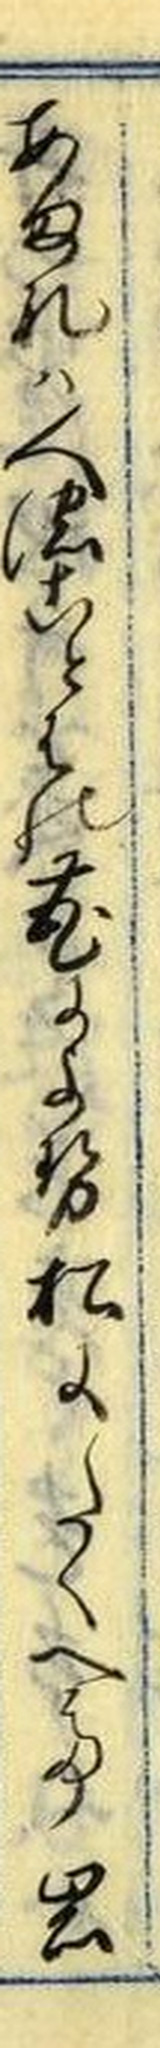あまれは人のことのは花によせ松にたゝへて岩

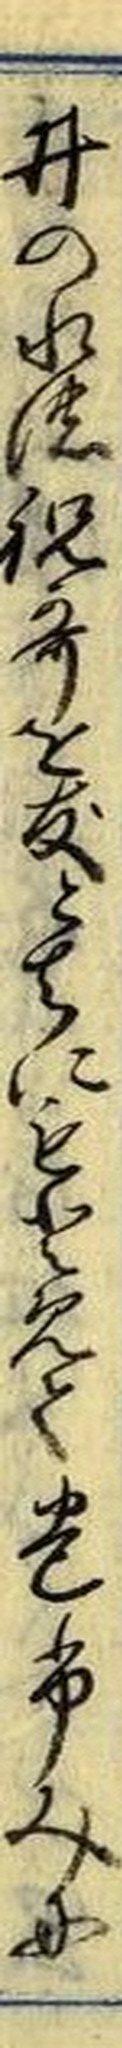ゐの水は祝哥を友とちにもとめて巻ふみに
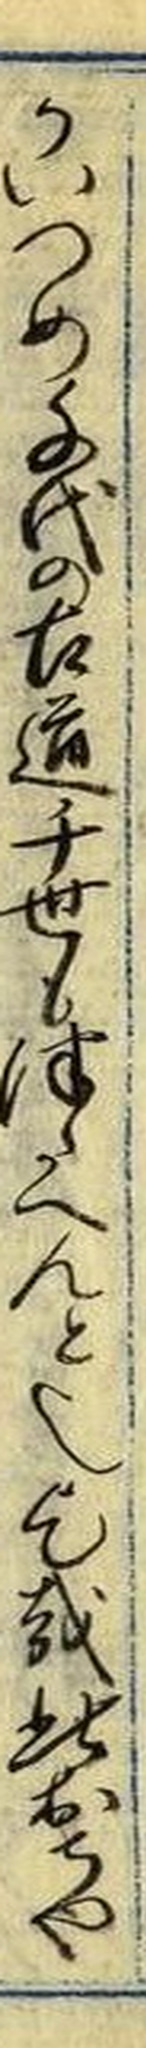かいつめ千代の古道千世もつたへんと也迄を此おちや
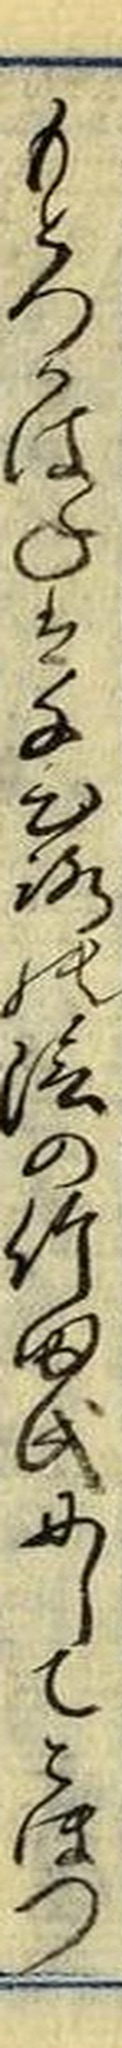もとつかはねはちひろの陰の竹田氏にしてとほつ
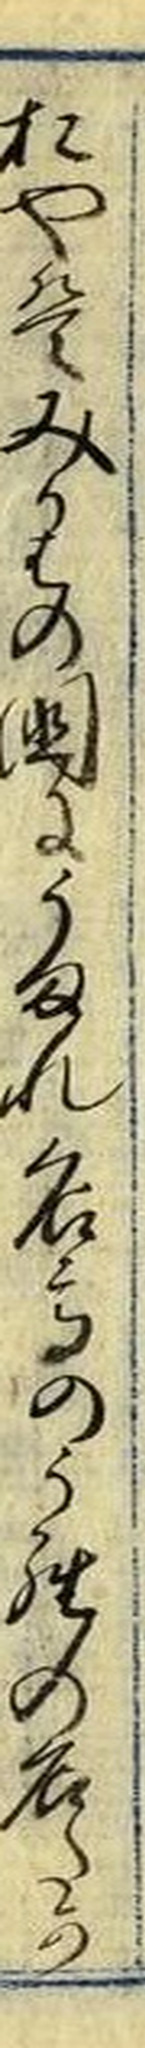おやはみかはの国にうまれ名高のうらの名たか
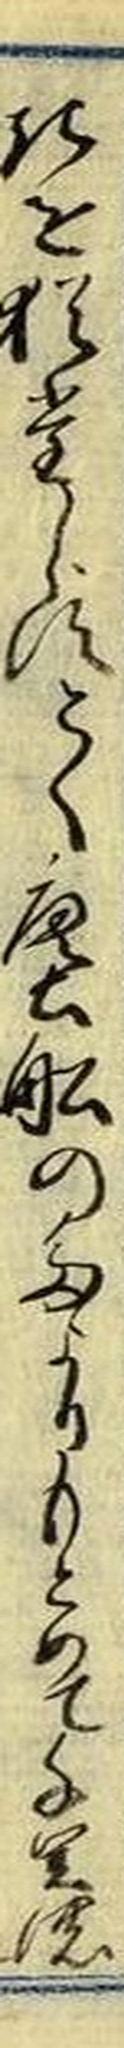きを猶たらすとく唐船のたよりもとめて千里の
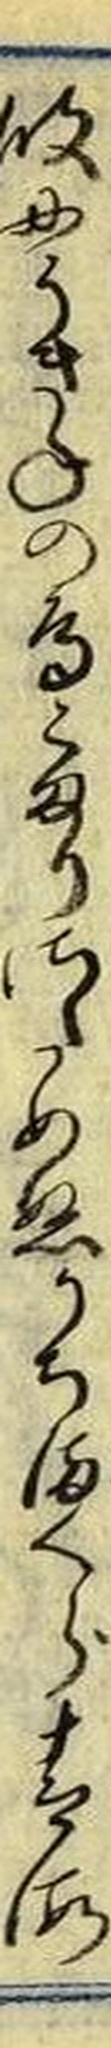波にうきねの鳥たまりさためぬうちまくら青海
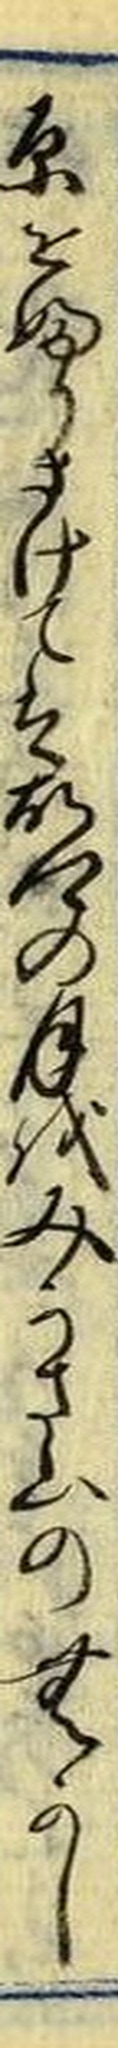原をふりさけては故郷の月をみかさ山のむかし
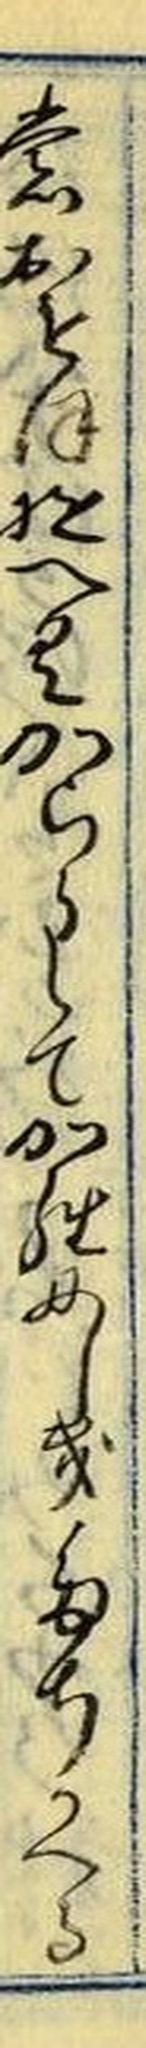もおもほゆへくからりしてからにしきたちかへる
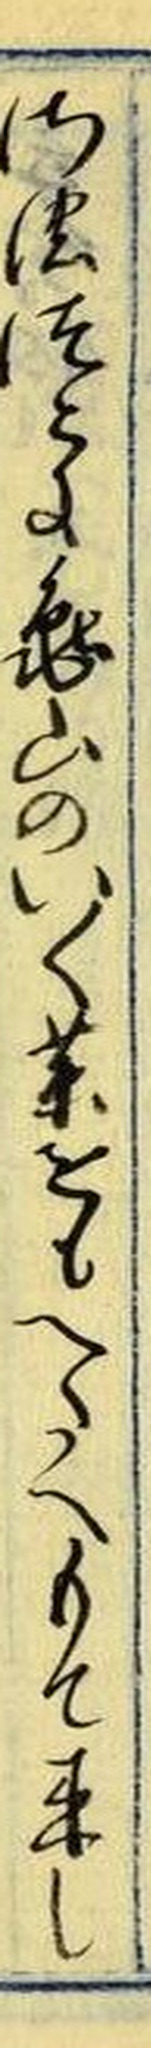さのつとに亀山のいくなをもへたへもて来し
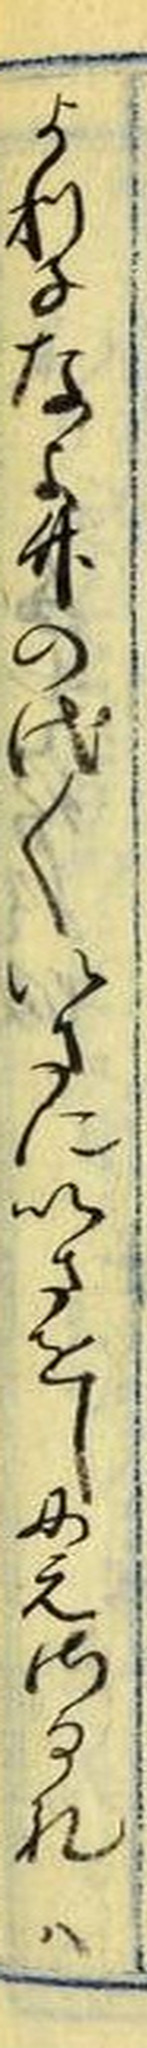よりなよ竹の代〳〵いまたいさをしにえさるれは
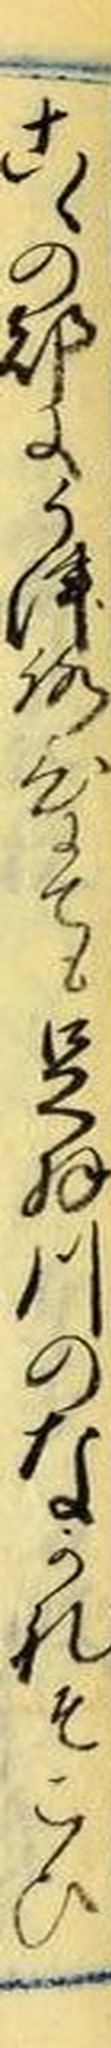こゝの都にうつろひにても足羽川のなかれそこひ
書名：温古集 三巻
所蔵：福井県文書館 Fukui Prefectural Archives
